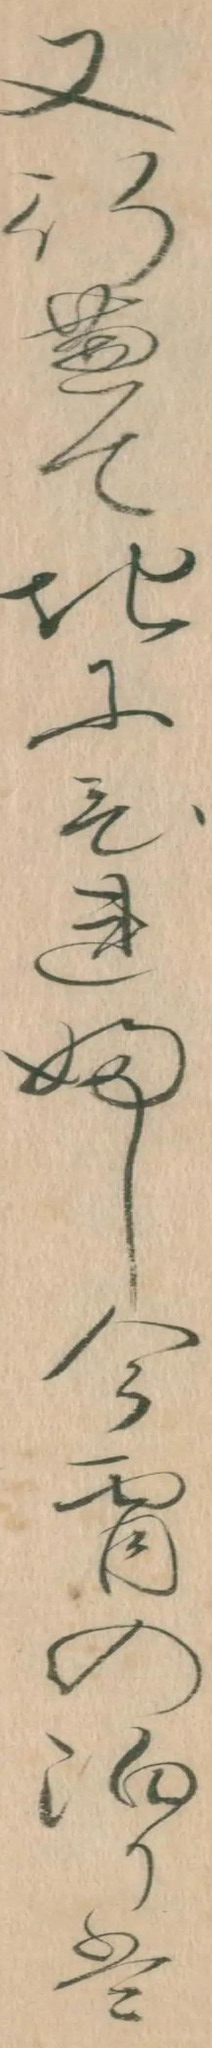又行兼て地にひれふし今宵の泊りは
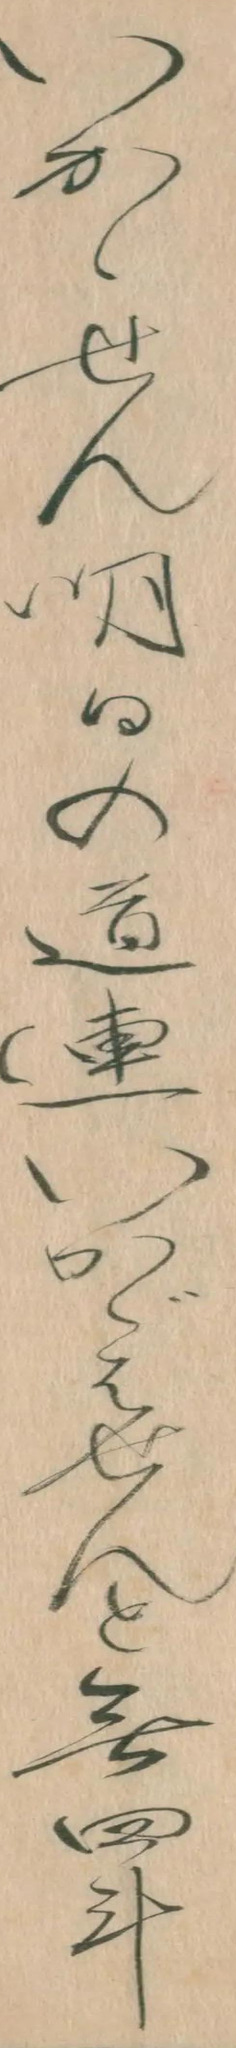いかゝせん明日の道連いかゞはせんと無回？斗
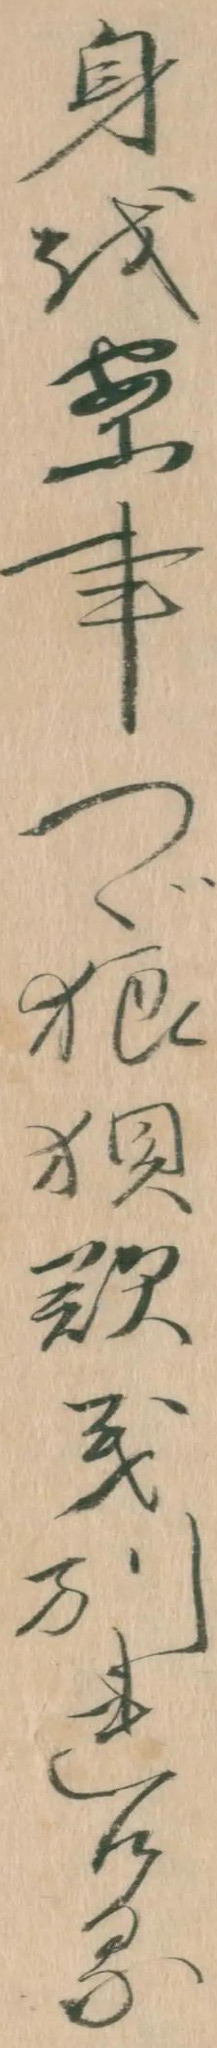身を案しつゞ狼狽歎き別れける
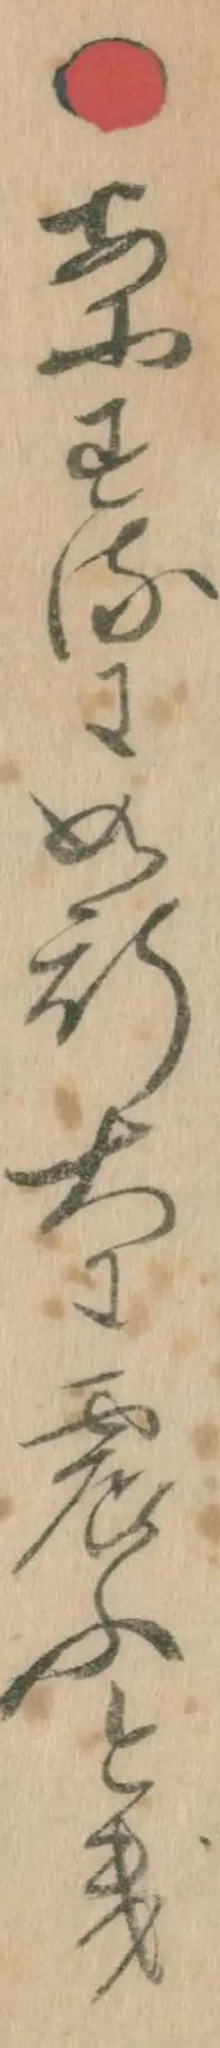○案するに如斯大に震ふとき
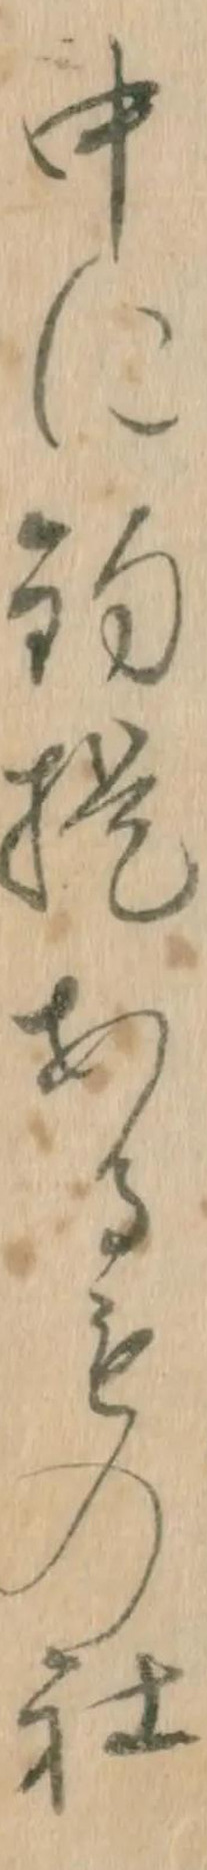中に釣提あるもの社
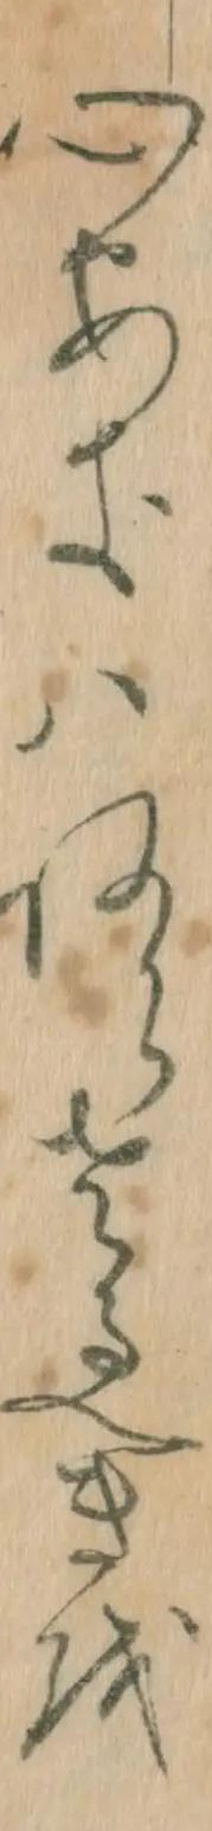心安きはあらさあるへきを
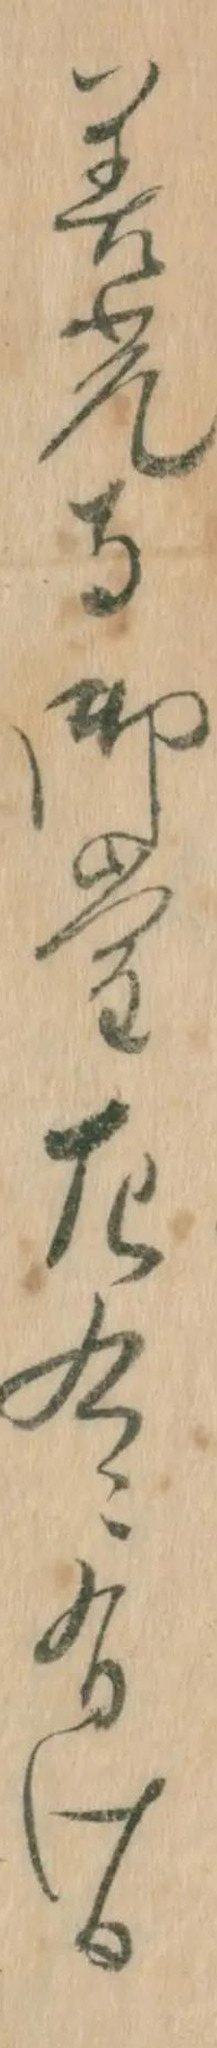善光寺御堂左右に有ける
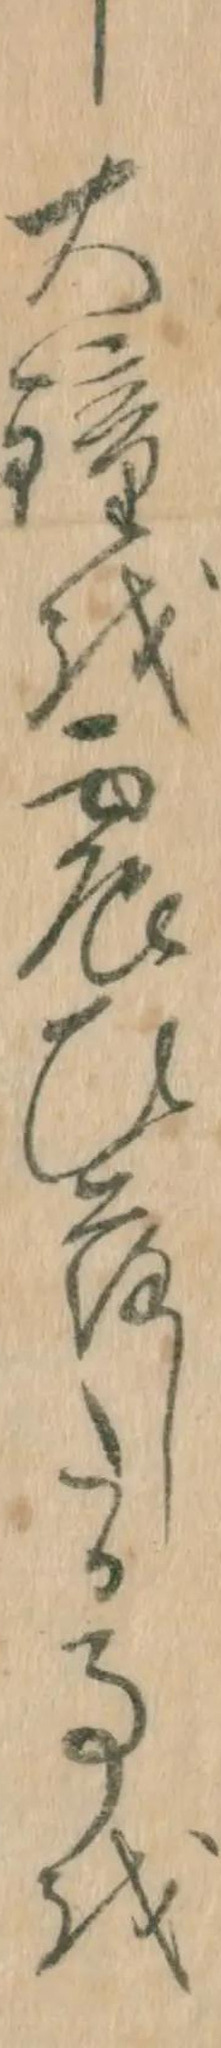大鐘を震ひ落したる事を
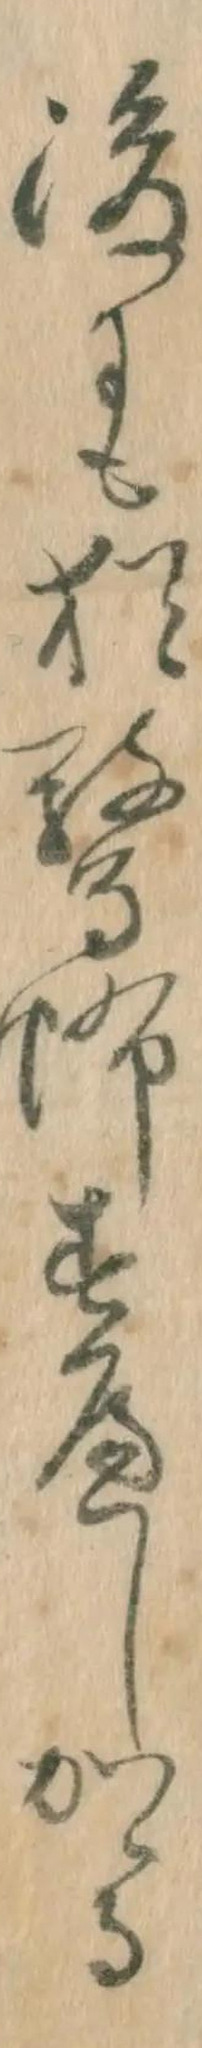後にも猶驚怖すへしかゝる
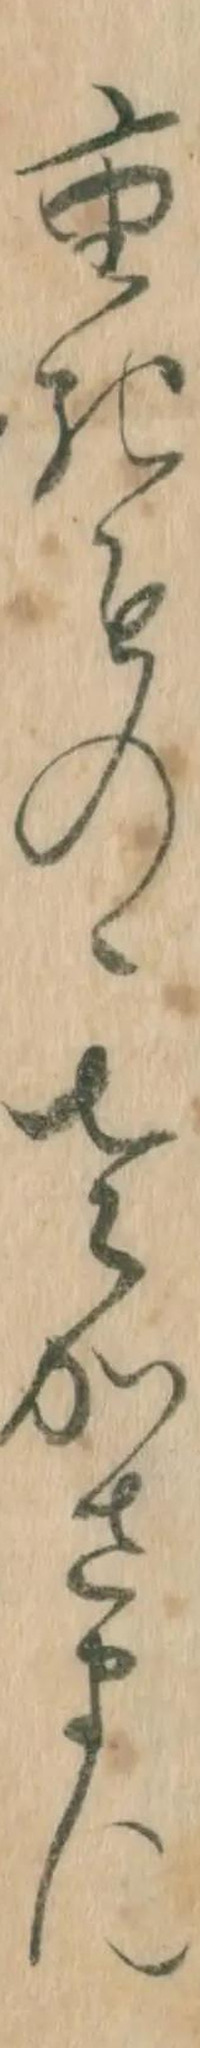重きものゝさかさまに
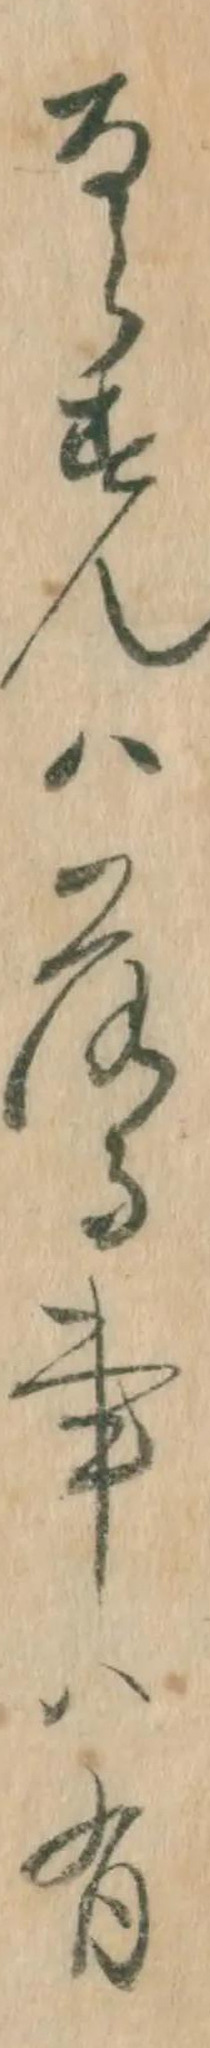ならすんは落つ事は有
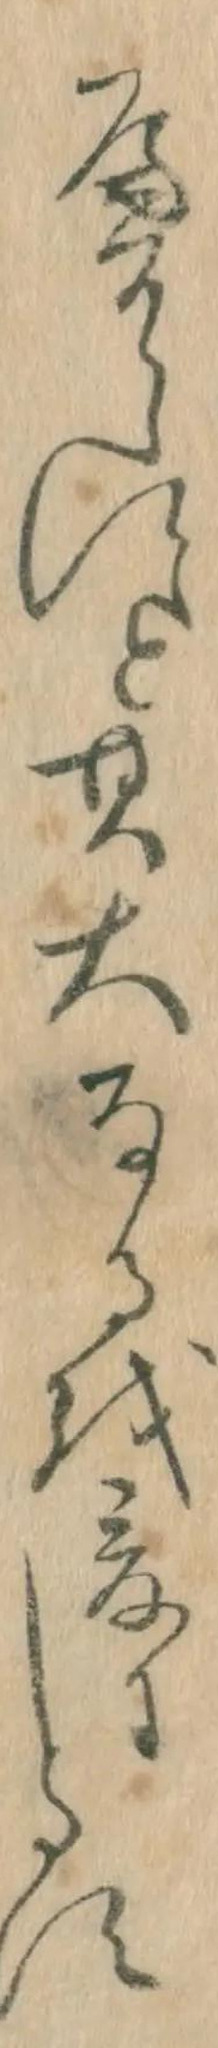へからすと其大なるを爰にしるす

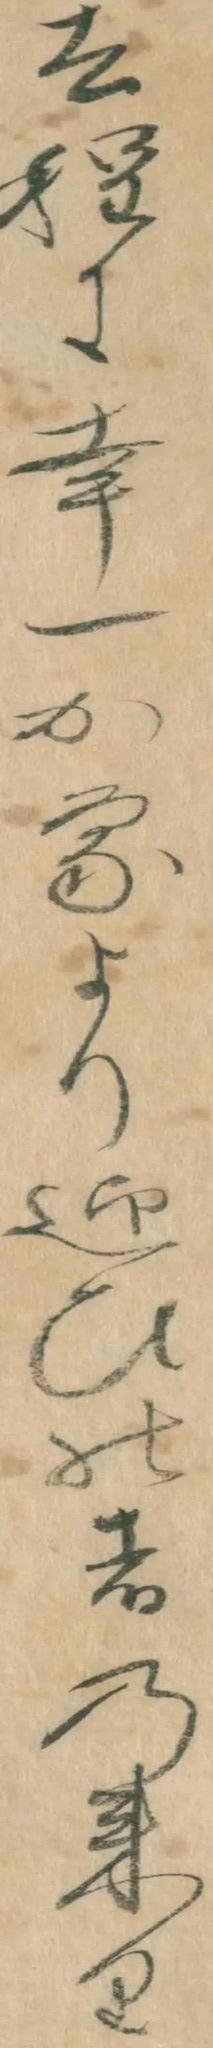去程に幸一か家より迎ひの者の来り
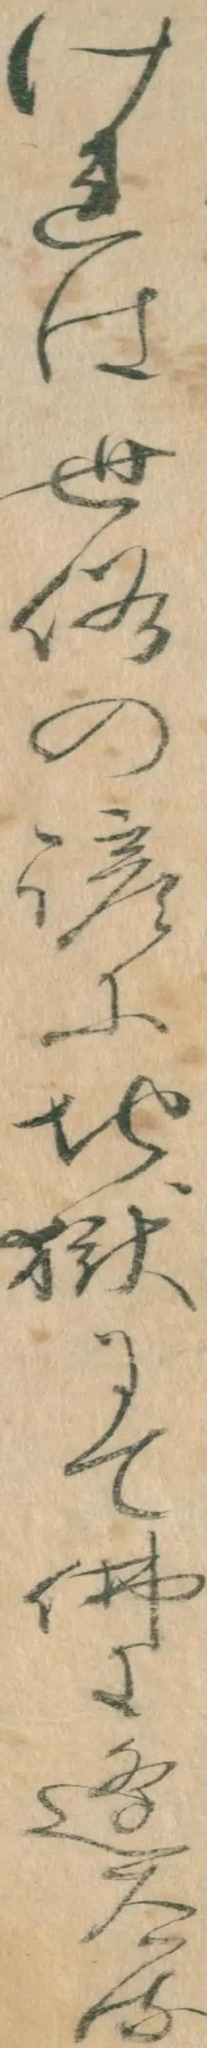けれは世俗の諺に地獄にて仏に逢たる
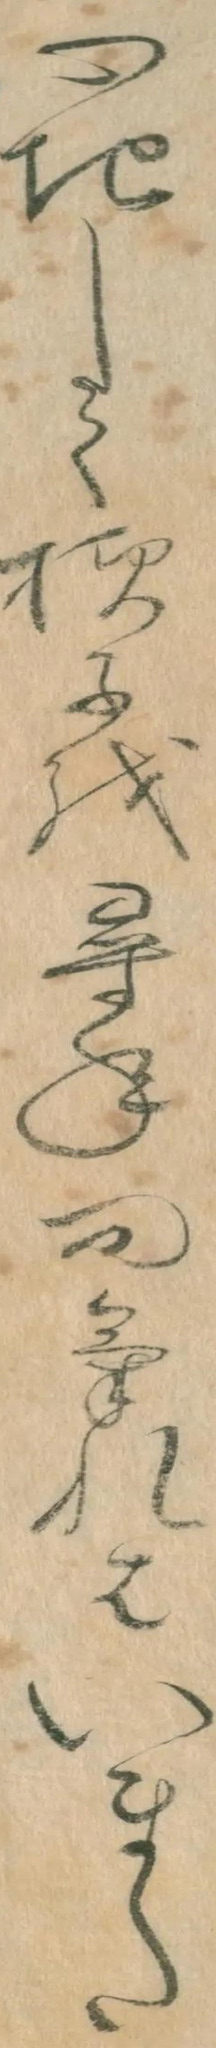心地して様子を尋ね問けれはいまた
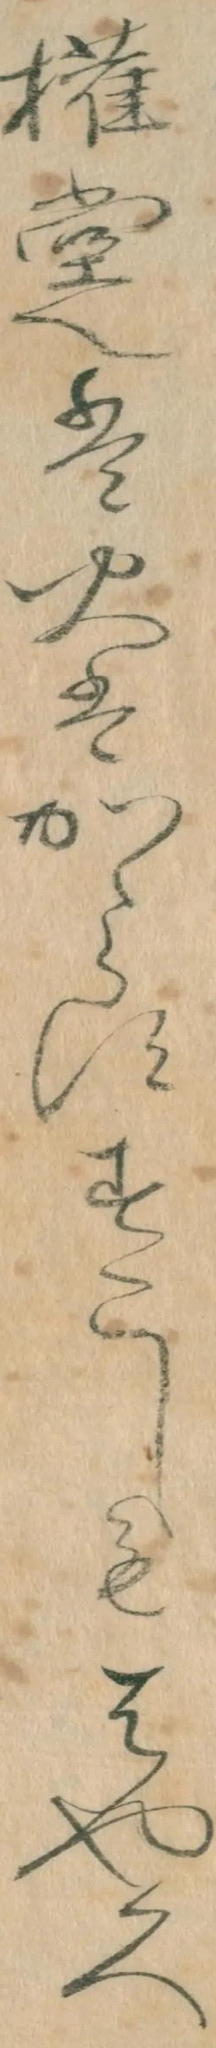権堂へは火はかゝらすすこしもはやく
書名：俗語之種. [4]
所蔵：国立国会図書館 National Diet Library, JAPAN
